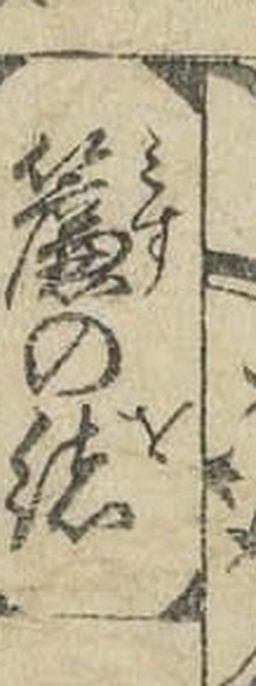簾の緒
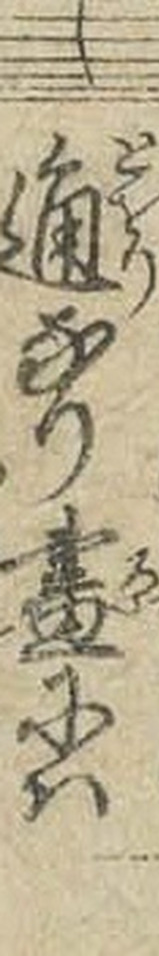通なり畫には
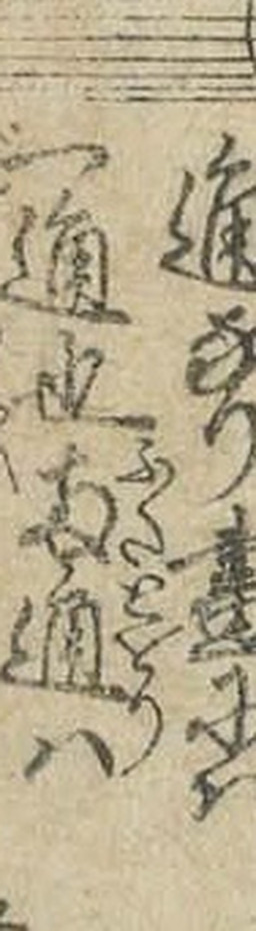一通也両通は
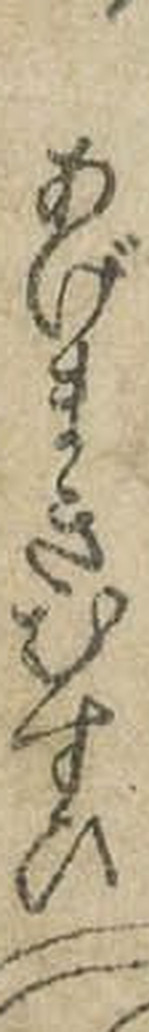あげまきむすひ

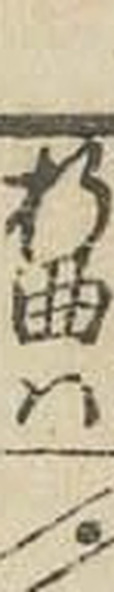折曲は
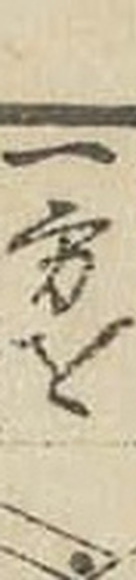一方を
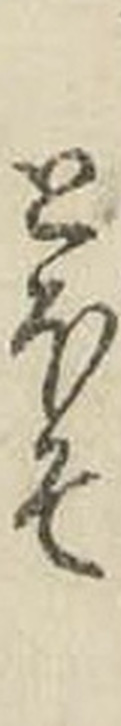とぼそ
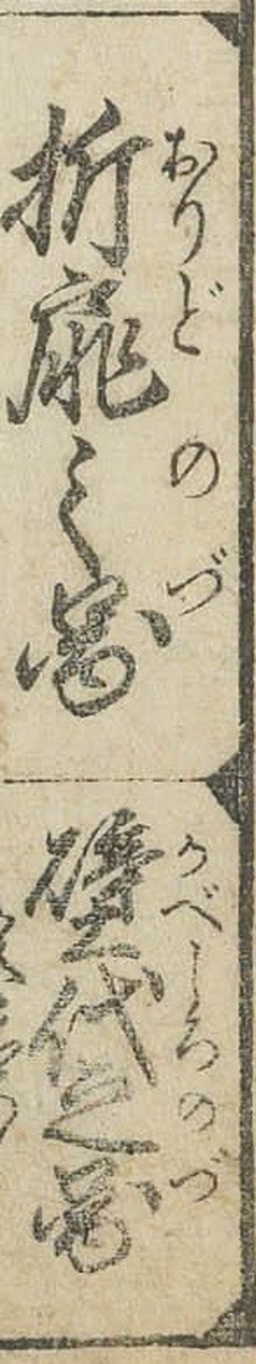折扉之図壁代之図
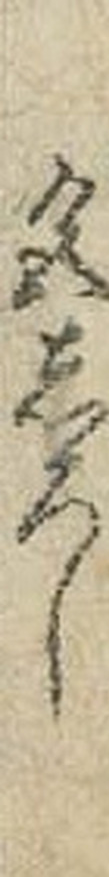色しろし

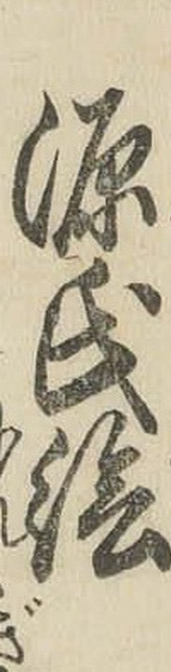源氏絵
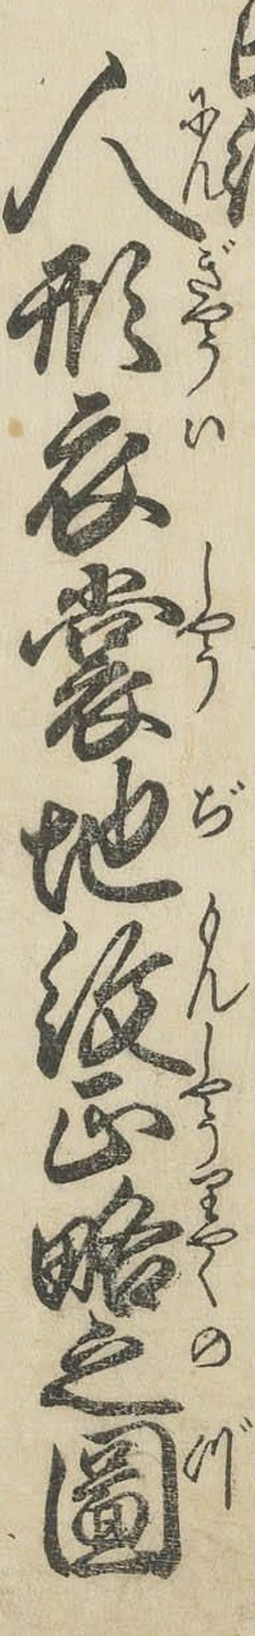人形衣裳地紋正略之図

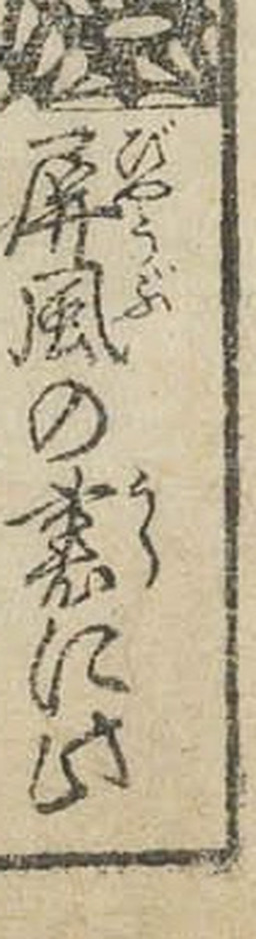屏風の裏に此
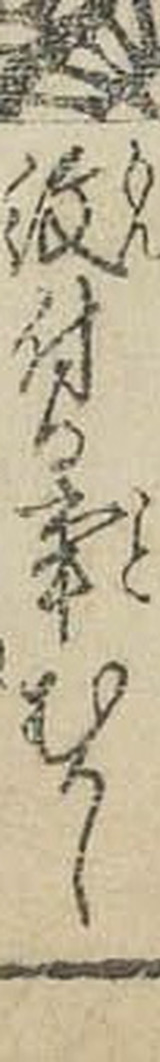紋付る事むかし
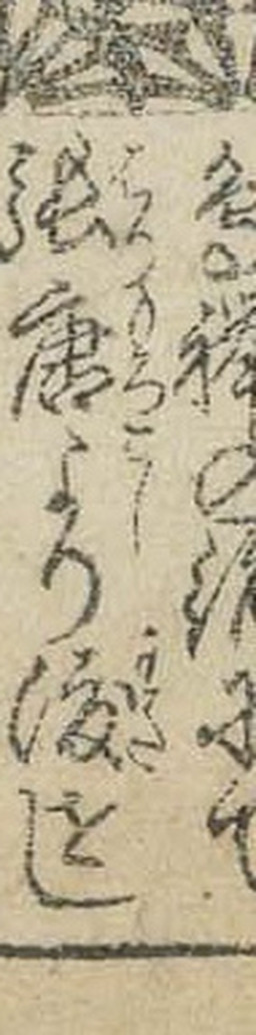張唐より渡せし
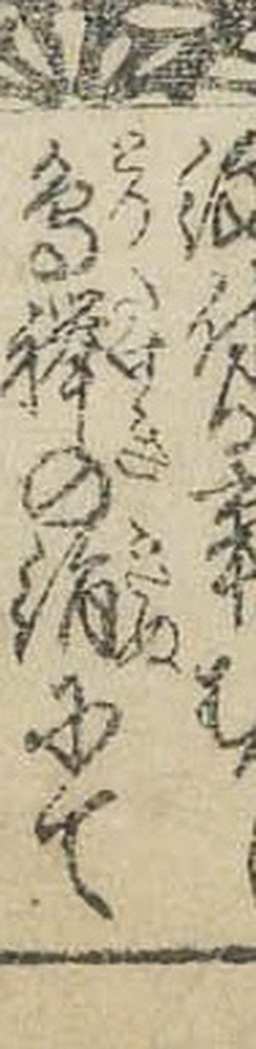鳥襷の絹にて
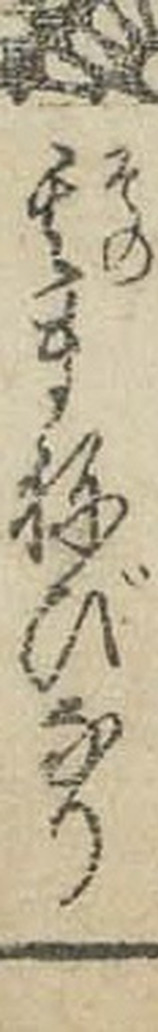其まねびなり
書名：絵本写宝袋 9巻 1之巻
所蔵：東京学芸大学教育コンテンツアーカイブ
